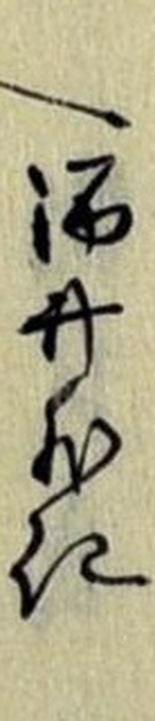酒井外記
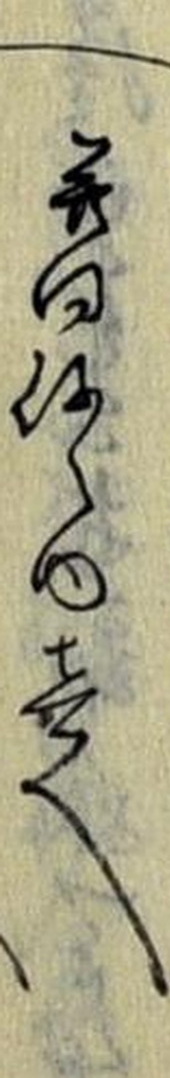并同役之内壱人
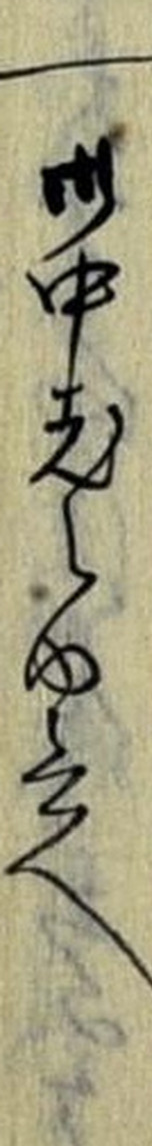御中老之内壱人
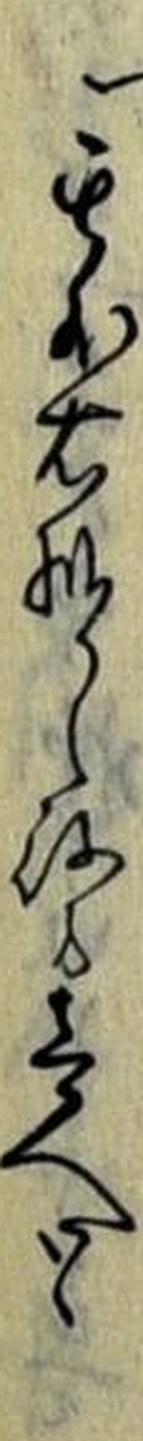其外右掛り之役方壱人ツヽ
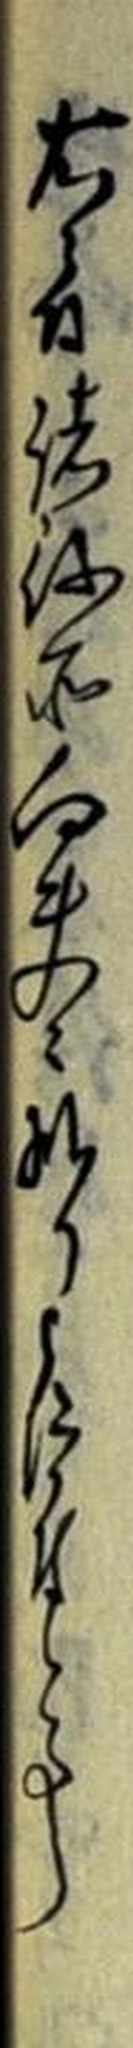右に付諸役所向夫々掛り被仰付候事
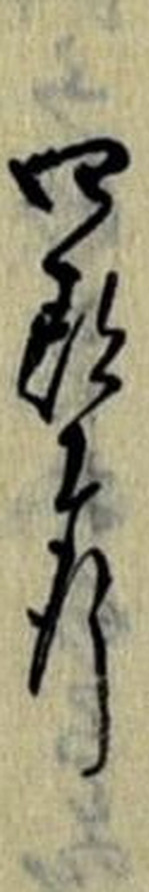四郡奉行
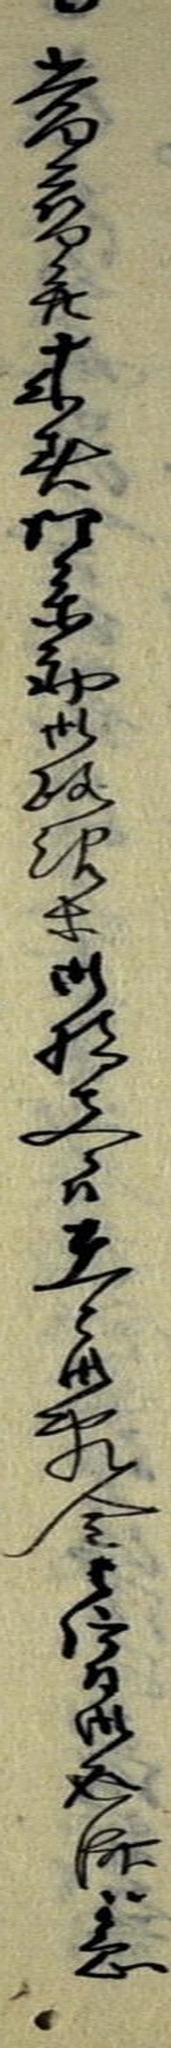〇当暮并来春御参勤御路銀等御指支に付在々御頼金被仰付御返済は急
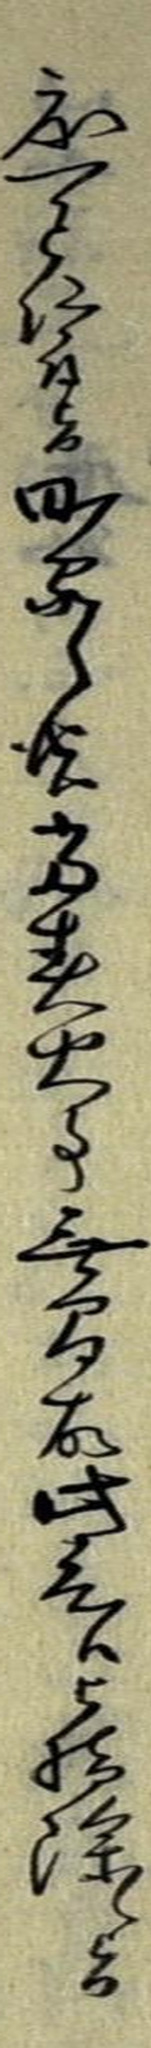度可被仰付旨町家之儀は当春火事無間故此度は被指除候旨
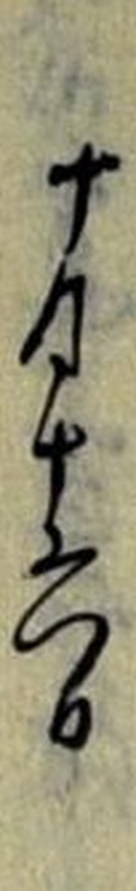十月十六日
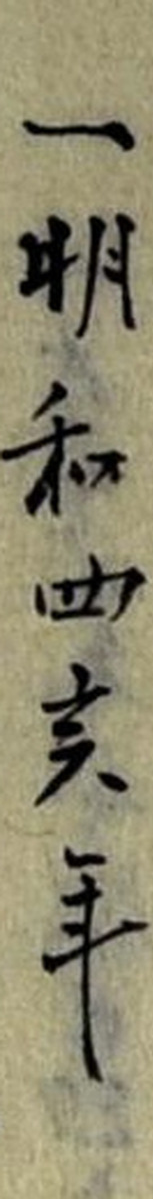一明和四亥年
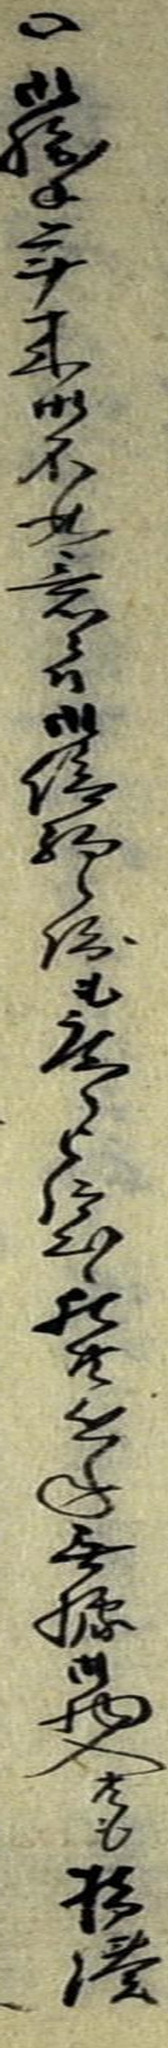〇御勝手年来御不如意に付御倹約之儀も度々被仰出候然共近年無拠御物入共も指湊
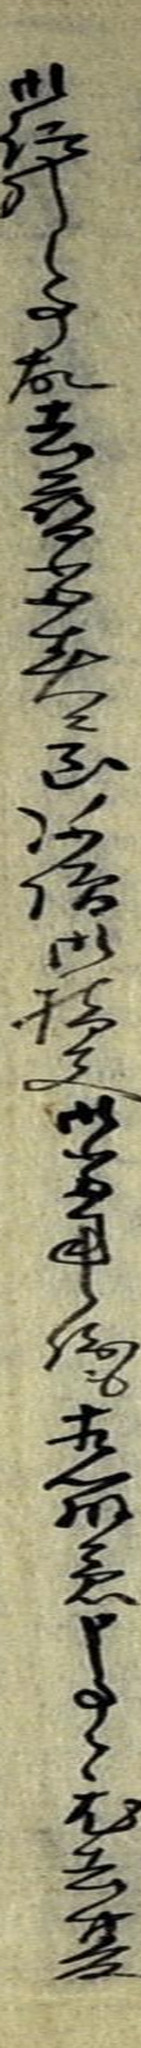御跡引之事故去暮当春に至弥増御指支御当用之儀も相弁兼申事に候尤去夏
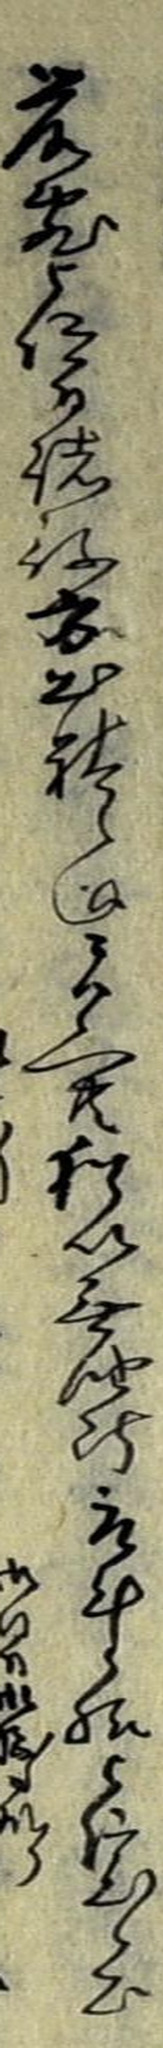厳敷被仰付諸役方出精之趣には候へ共猶以無油断取斗候様被仰出候以上
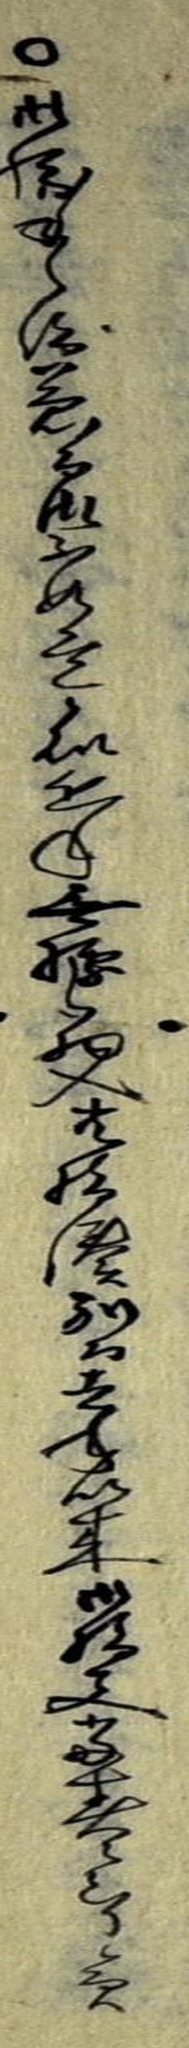〇御勝手之儀兼而御不如意候処近年無拠御物入共指湊別而去年以来御指支当春に至り候而は

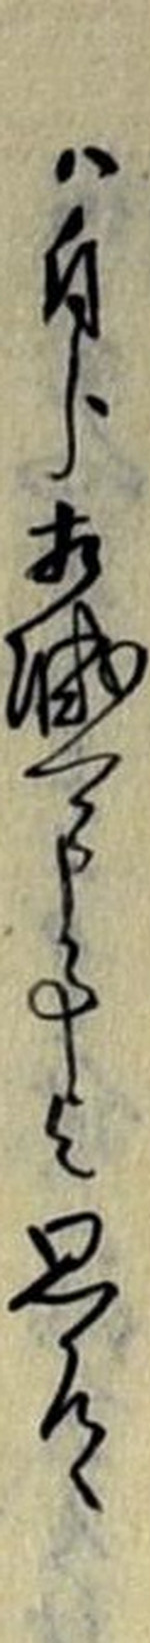は自ら相減可申事と思召候
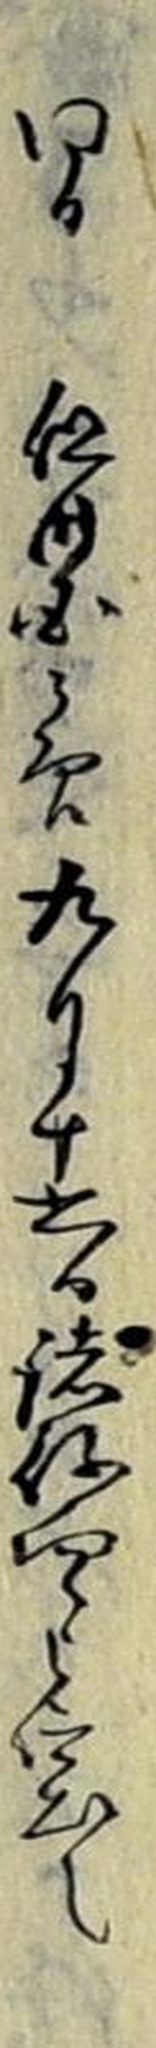同日但御国に而は九月十六日諸役向へ被仰出之
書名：命令之部 二
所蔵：福井県文書館 Fukui Prefectural Archives
